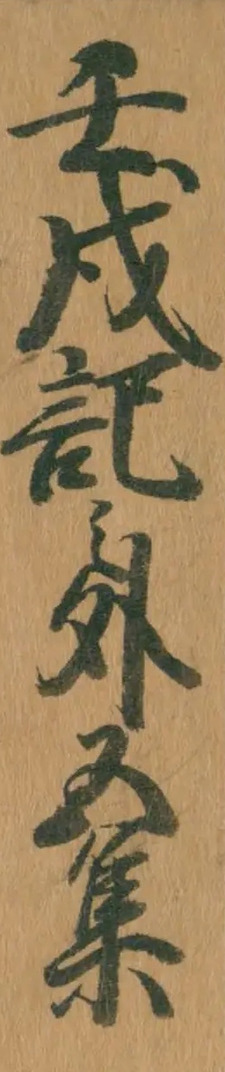「壬戌記之外五集
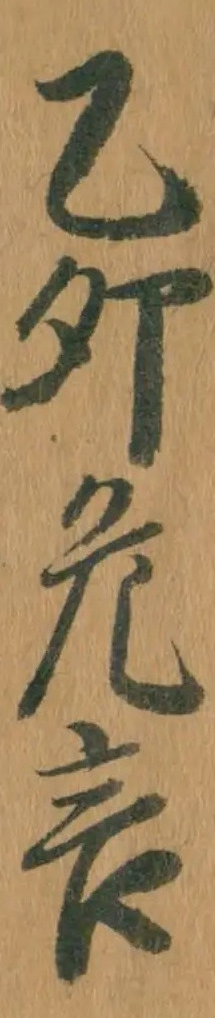乙卯危言
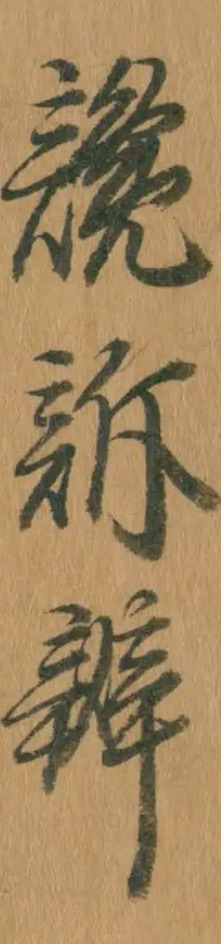讒訴辨
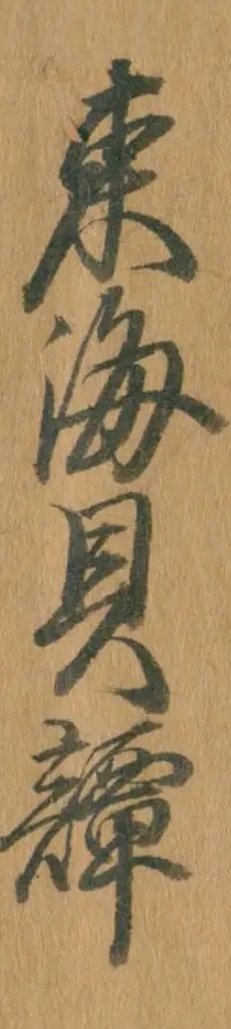東海貝譚
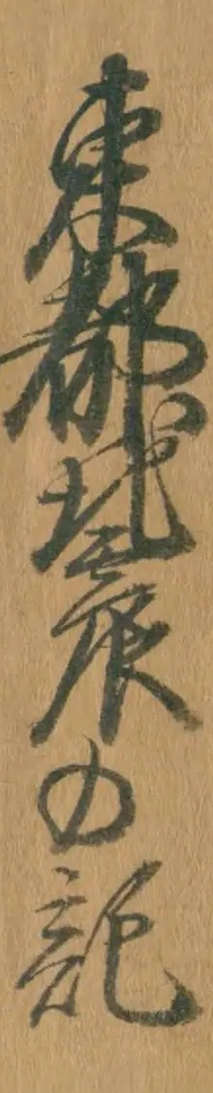東都地震の記
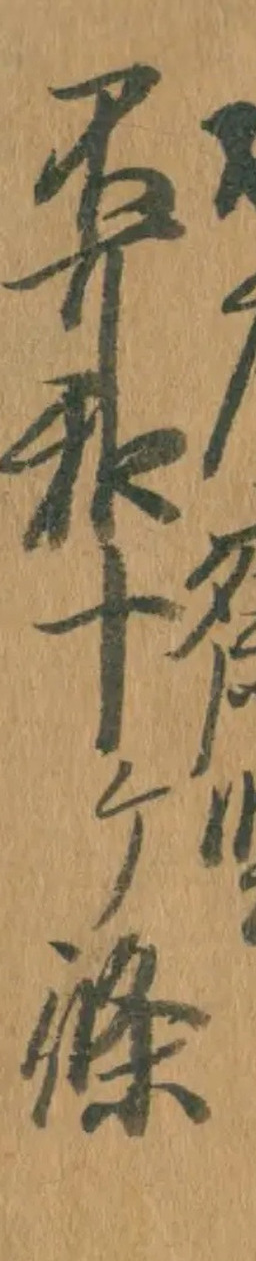不可和十ヶ條」

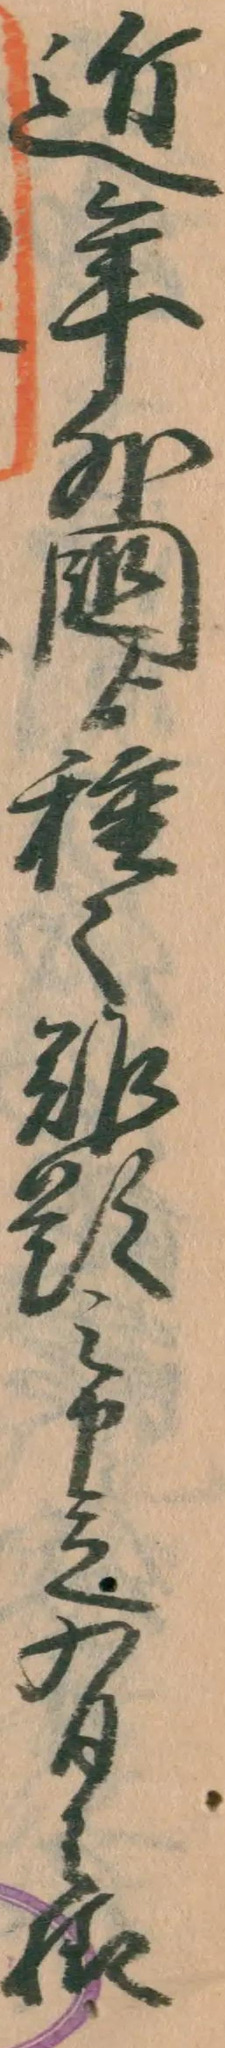近年外国より種々難題之申立有之様
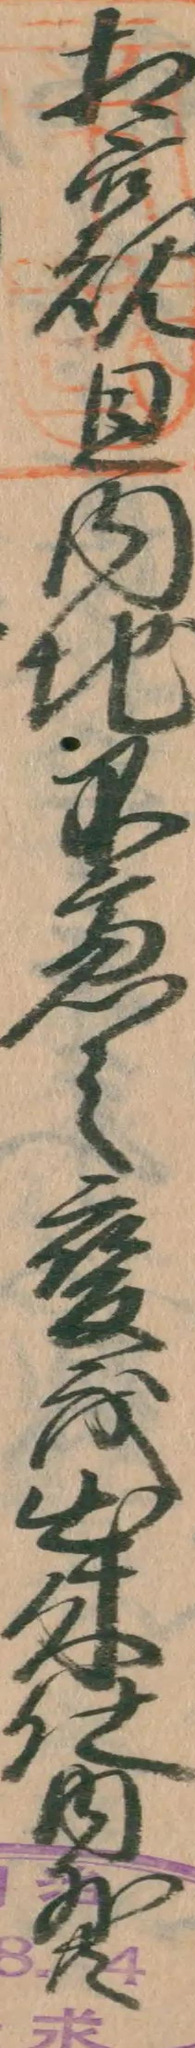相窺且内地不慮之変も出来仕内外共
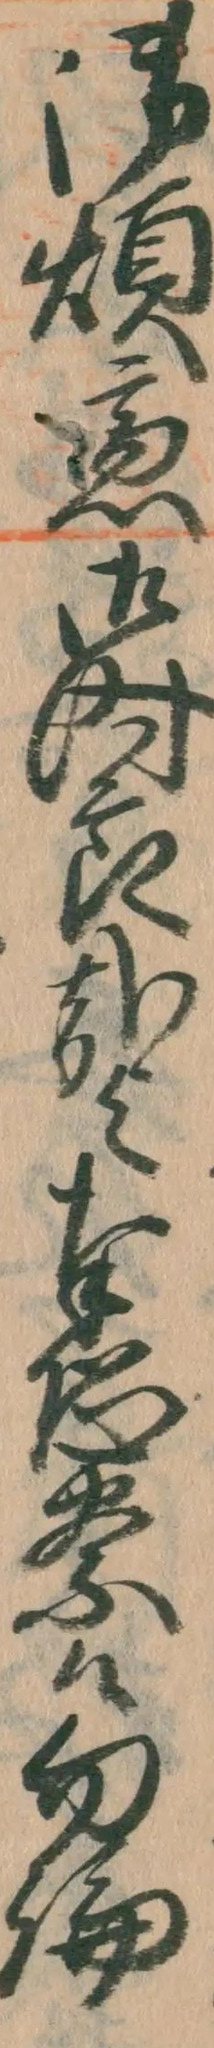御煩慮御時節柄哉と奉恐察候勿論
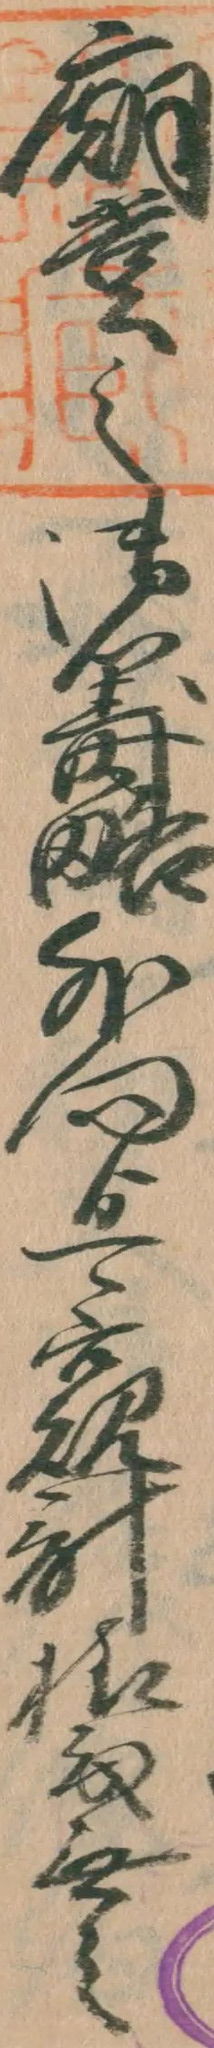廟堂之御籌略外向より可窺計様も無之
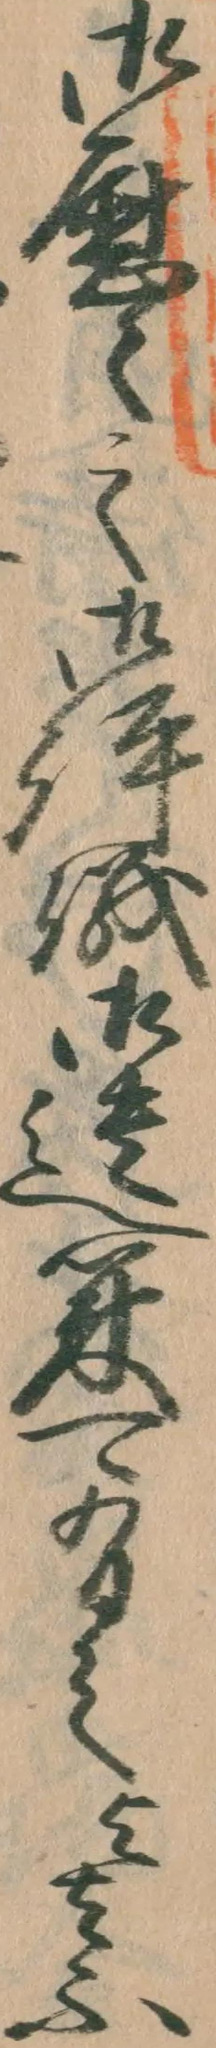御歴々之御評議御違策可有之とは不
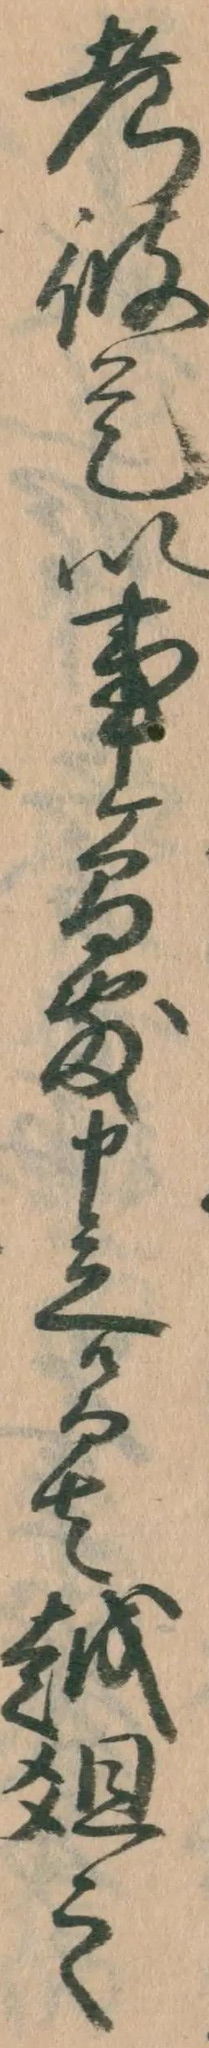考彼是以事ケ間敷申立候ては越俎之
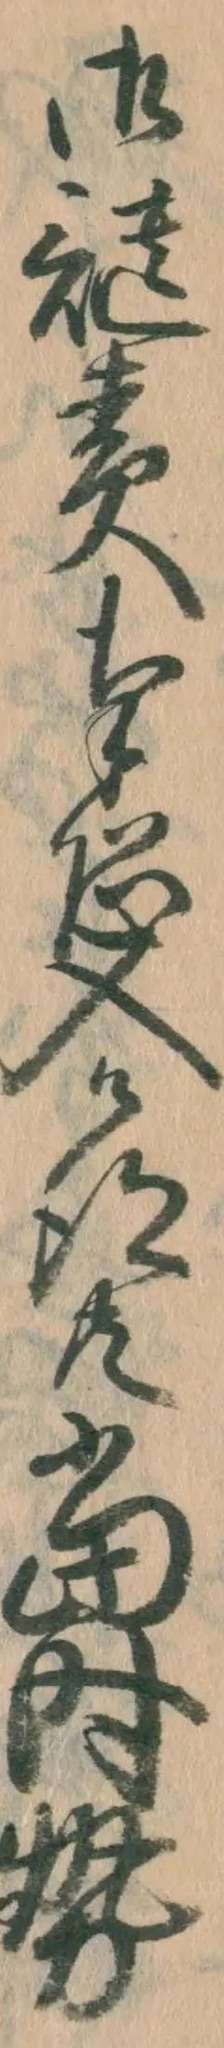御譴責奉恐入候得共当時勢
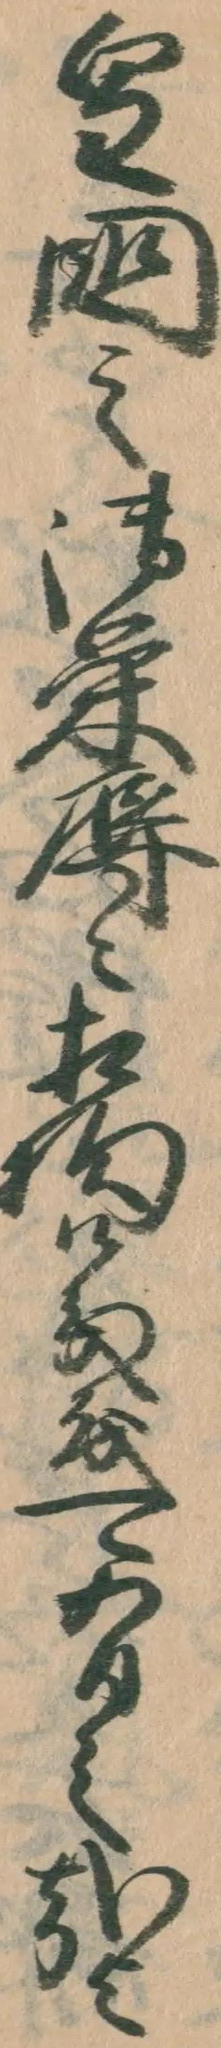皇国之御栄辱ニ相拘候義も可有之哉と
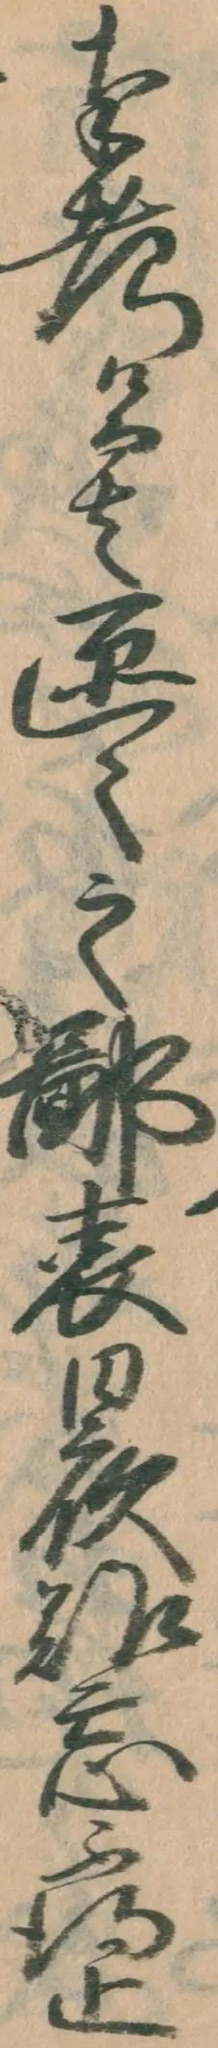奉考候ては区々之鄙表日夜難忘不得止
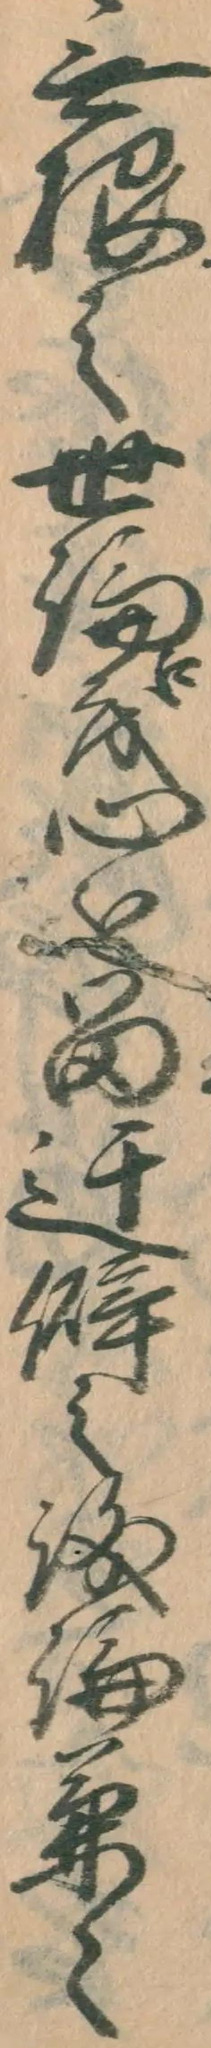無根之世論えも心を留迂僻之議論兼々
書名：麗斎叢書. 20
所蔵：国立国会図書館 National Diet Library, JAPAN
